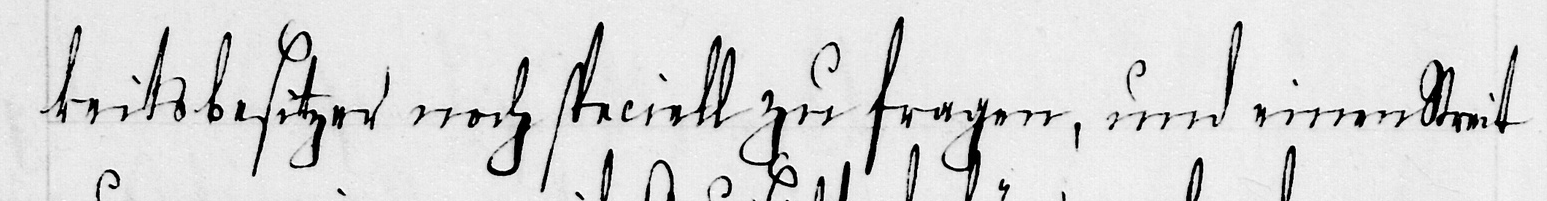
keitsbesitzer noch speciell zu fragen, und einen Streit
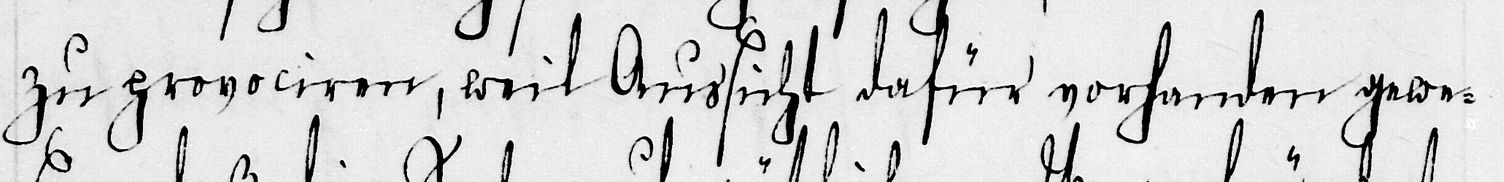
zu provociren, weil Aussicht dafür vorhanden gewe¬
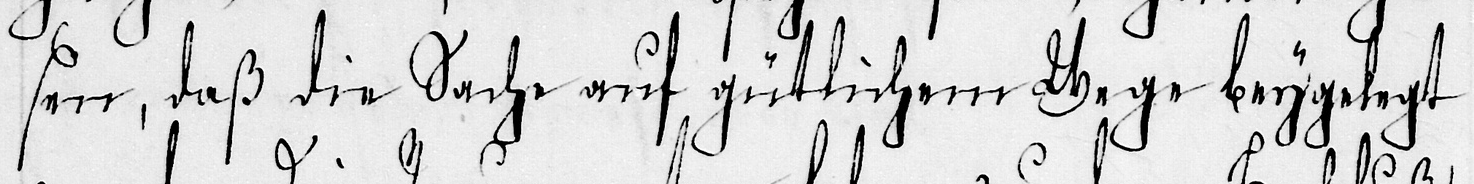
sen, daß die Sache auf gütlichem Wege beygelegt
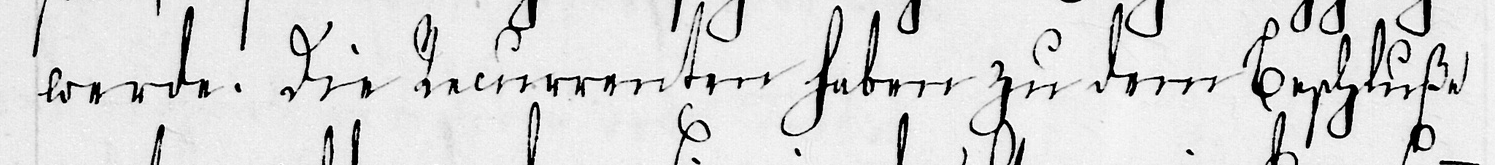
werde. Die Recurrenten haben zu dem Beschluße
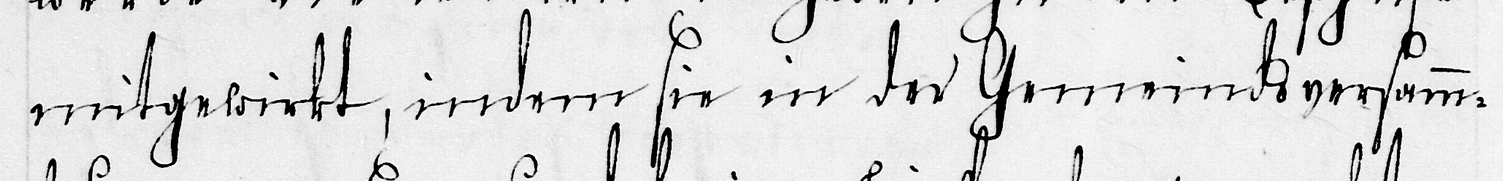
mitgewirkt, indem sie in der Gemeindsversamm¬
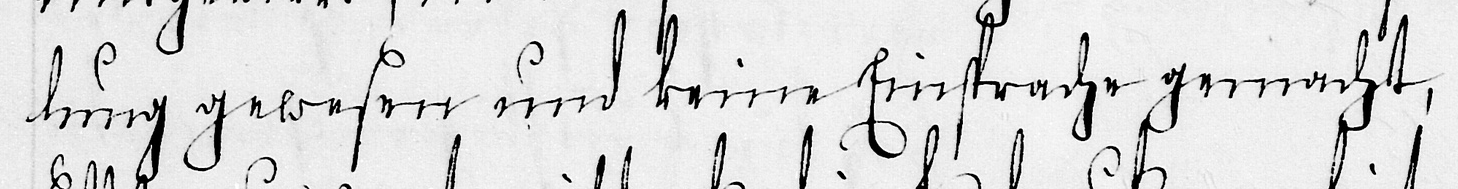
lung gewesen und keine Einsprache gemacht,
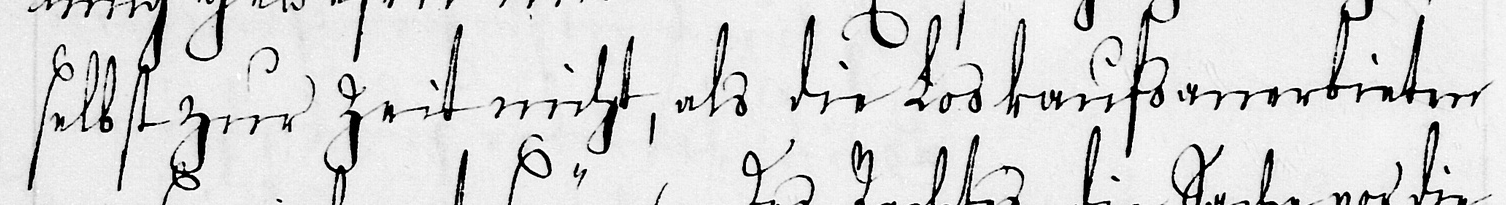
selbst zur Zeit nicht, als die Loskaufsanerbieten
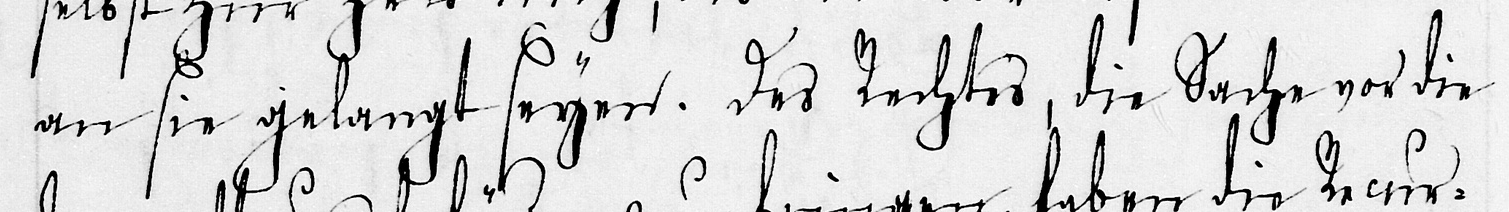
an sie gelangt seyen. Des Rechtes, die Sache vor die
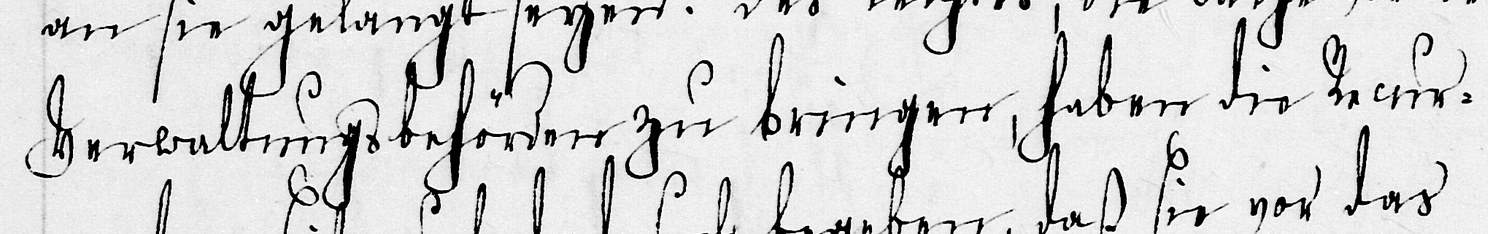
Verwaltungsbehörden zu bringen, haben die Recur¬
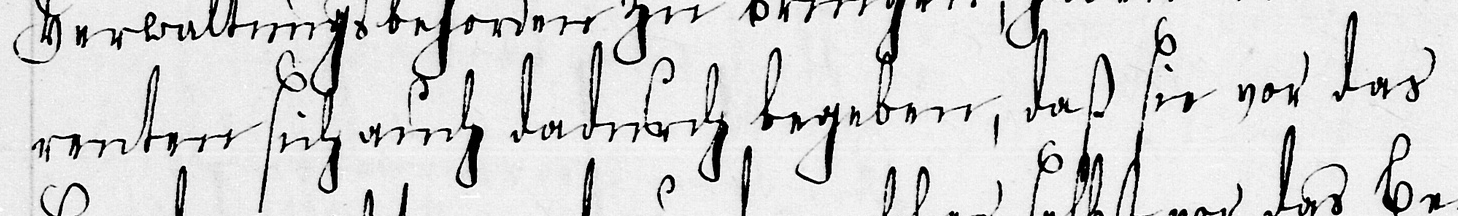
renten sich auch dadurch begeben, daß sie vor das
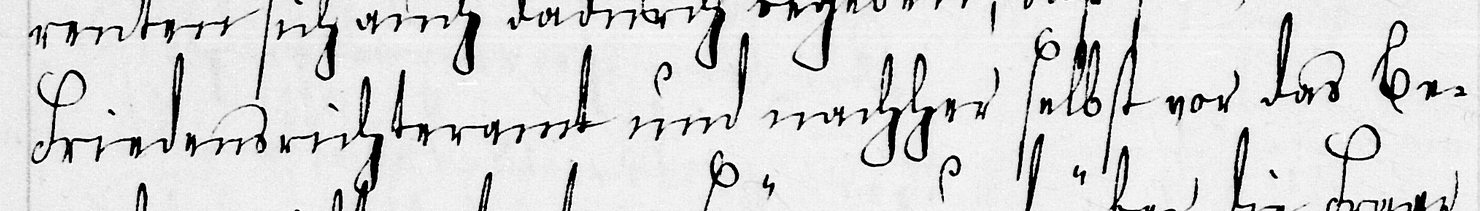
Friedensrichteramt und nachher selbst vor das Be¬
